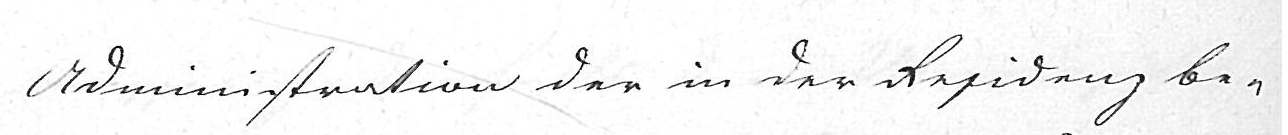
Administration der in der Residenz be-
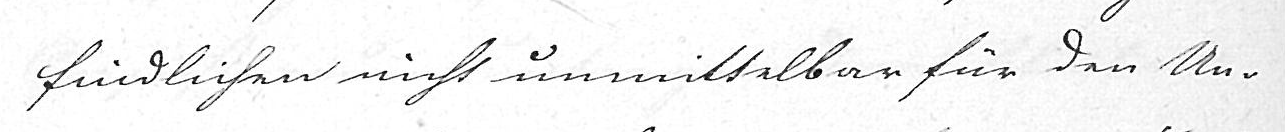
findlichen nicht unmittelbar für den Un-
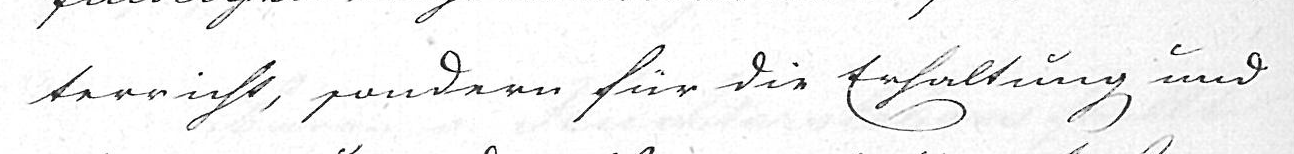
terricht, sondern für die Erhaltung und
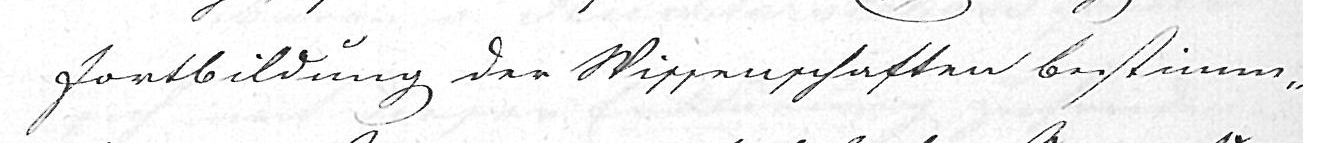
Fortbildung der Wissenschaften bestimm-
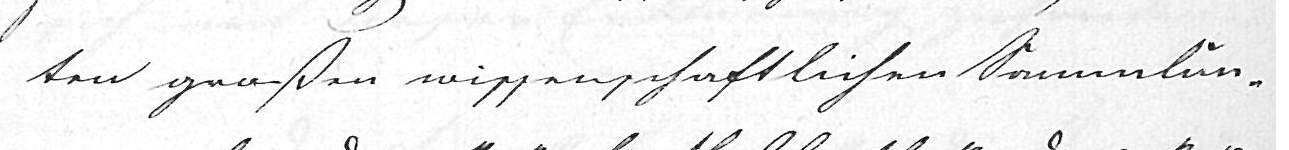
ten großen wissenschaftlichen Sammlun-
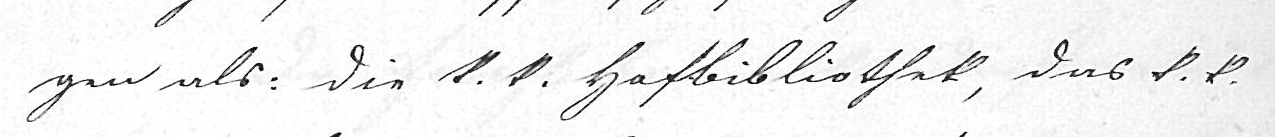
gen als: die k.k. Hofbibliothek, das k.k.
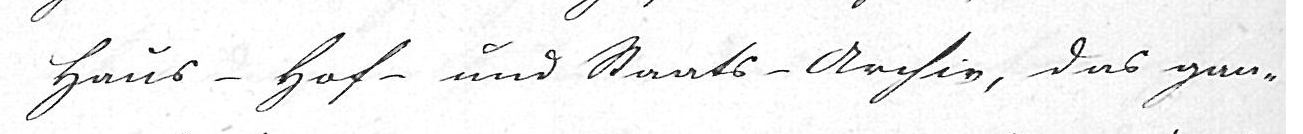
Haus-, Hof- und Staats-Archiv, das gan-
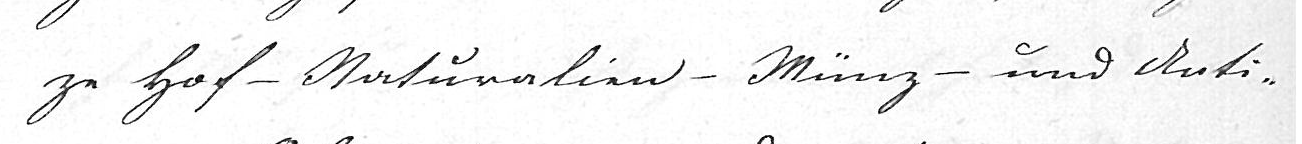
ze Hof-Naturalien-Münz- und Anti-
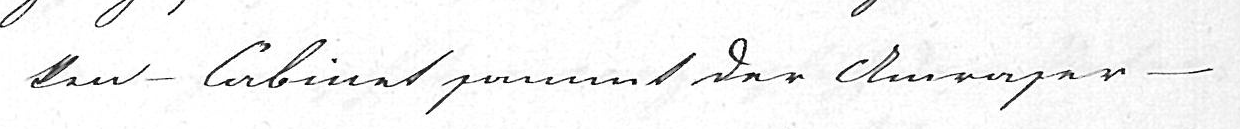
ken-Cabinet sammt der Amraser-
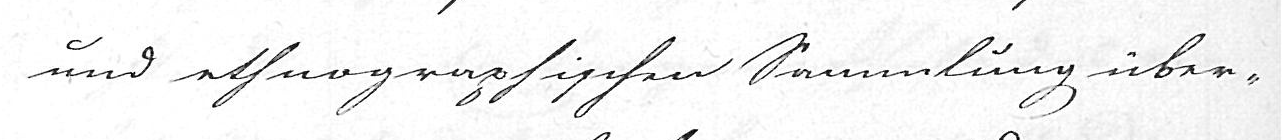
und ethnographischen Sammlung über-
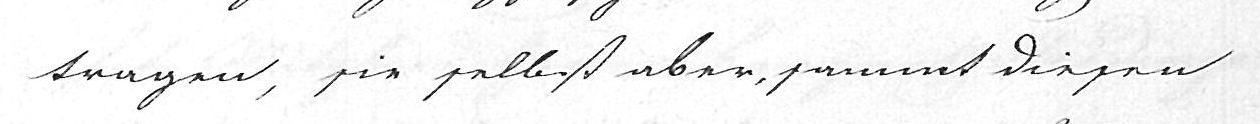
tragen, sie selbst aber, sammt diesen
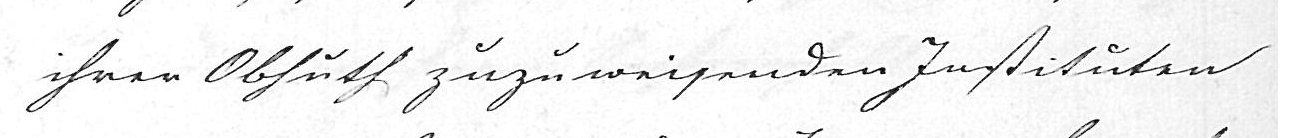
ihrer Obhuth zuzuweisenden Instituten
